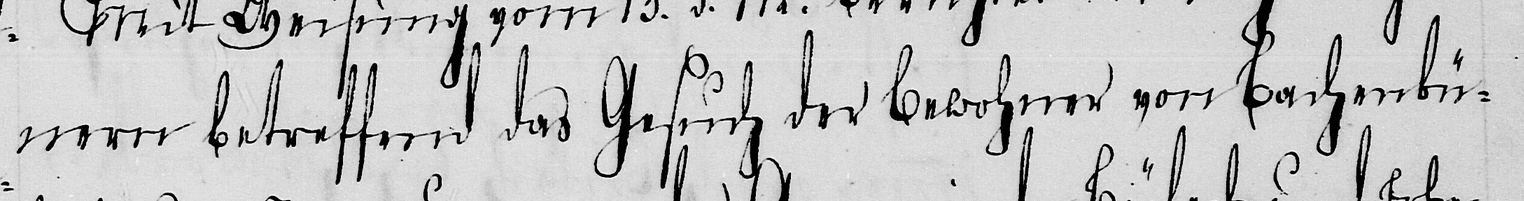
nern betreffend das Gesuch der Bewohner von Bachenbü¬
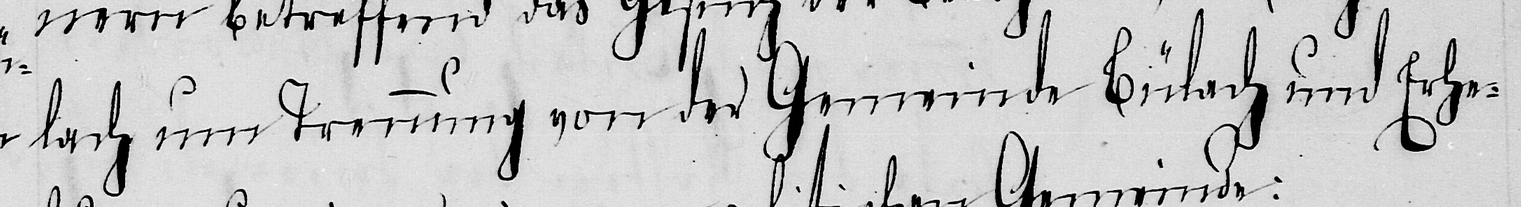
lach um Trennung von der Gemeinde Bülach und Erhe¬
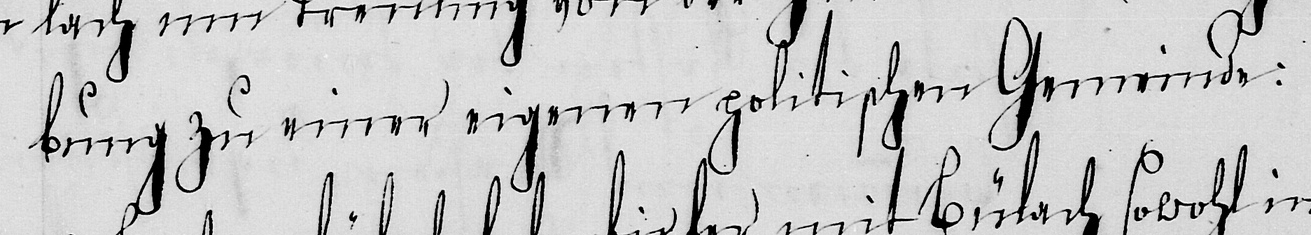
bung zu einer eigenen politischen Gemeinde:
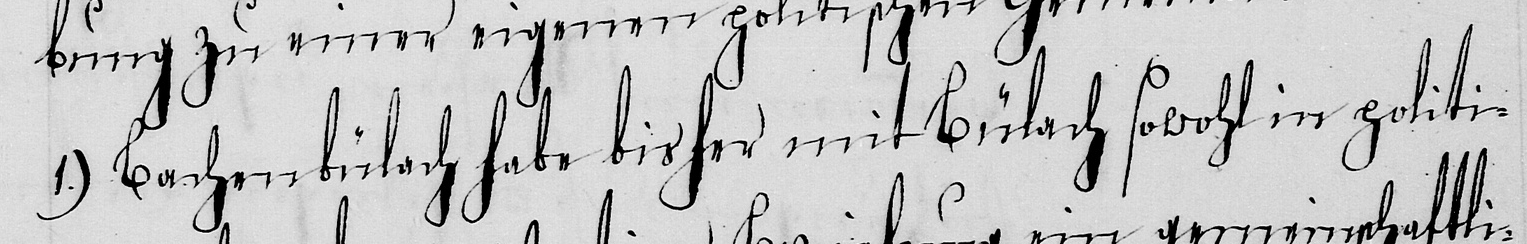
1.) Bachenbülach habe bisher mit Bülach sowohl in politi¬
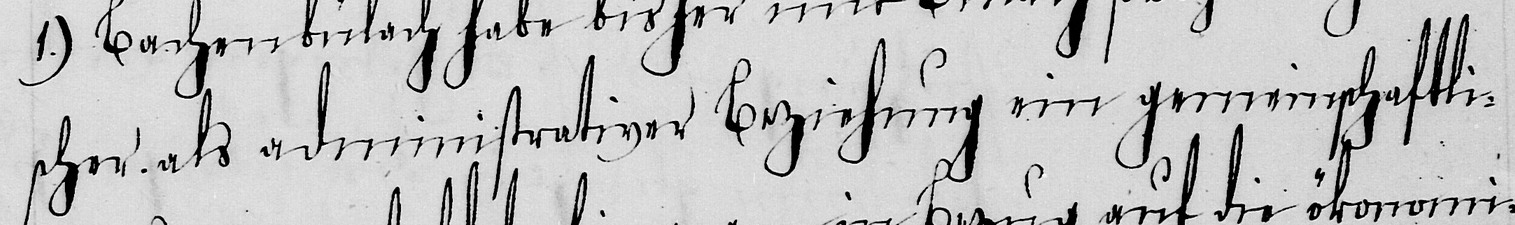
scher als administrativer Beziehung ein gemeinschaftli¬
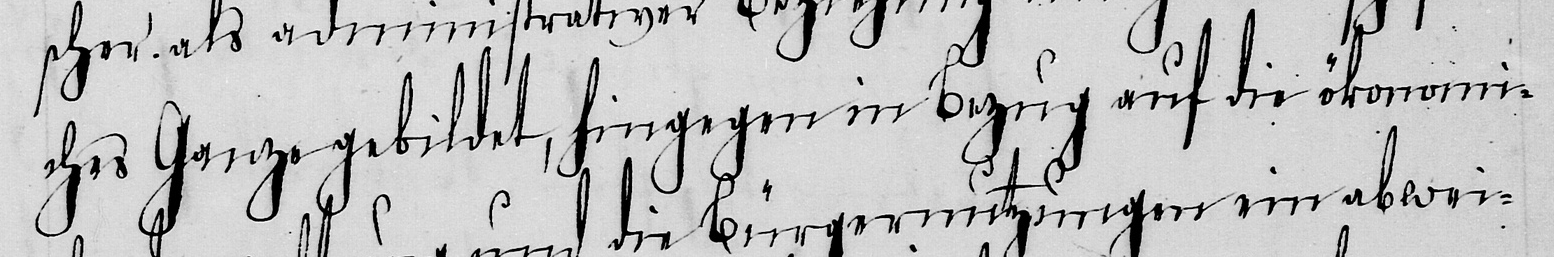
ches Ganze gebildet, hingegen in Bezug auf die ökonomi¬
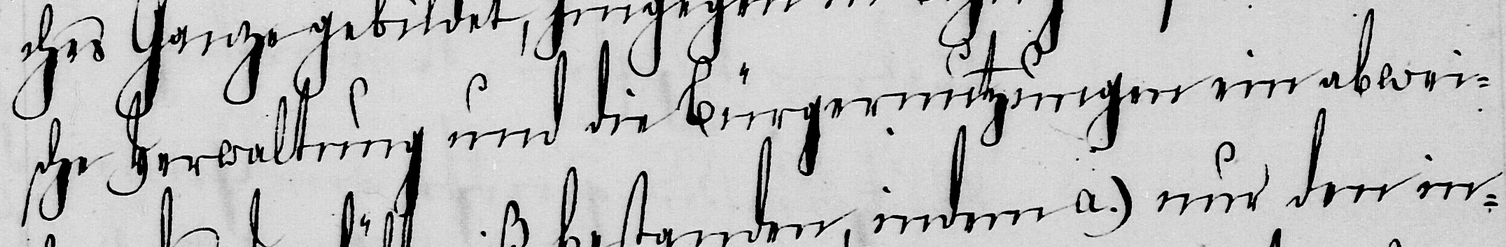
sche Verwaltung und die Bürgernutzungen ein abwei¬
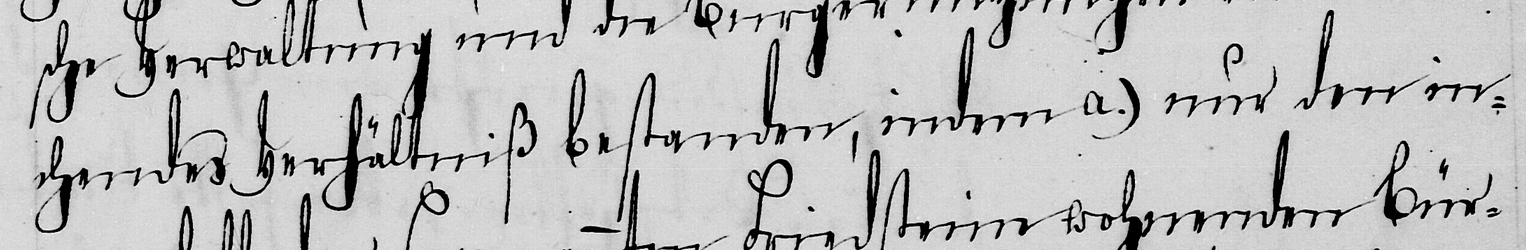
chendes Verhältniß bestanden, indem a.) nur den in¬
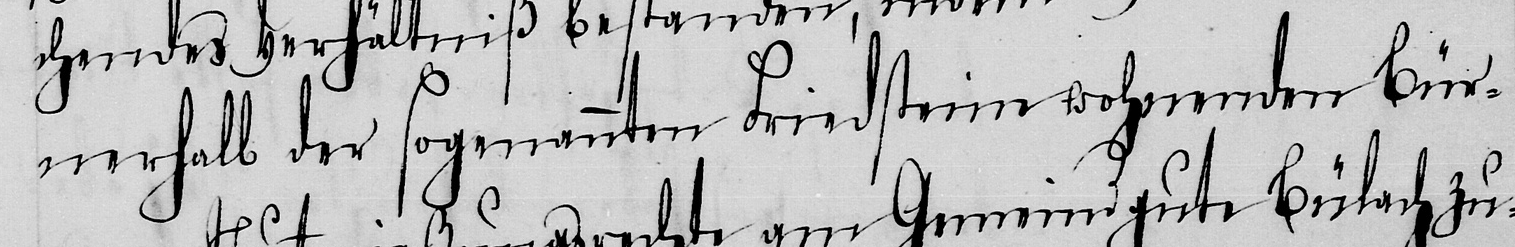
nerhalb der sogenannten Friedsteine wohnenden Bür¬
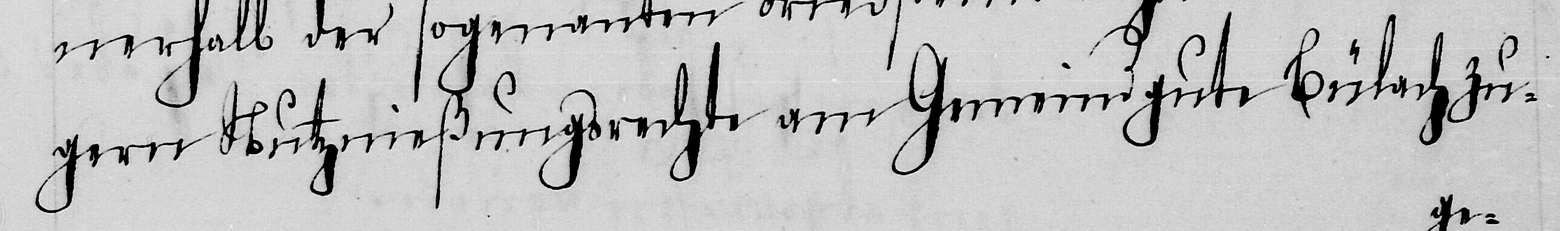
gern Nutznießungsrechte am Gemeindgute Bülach zu-
